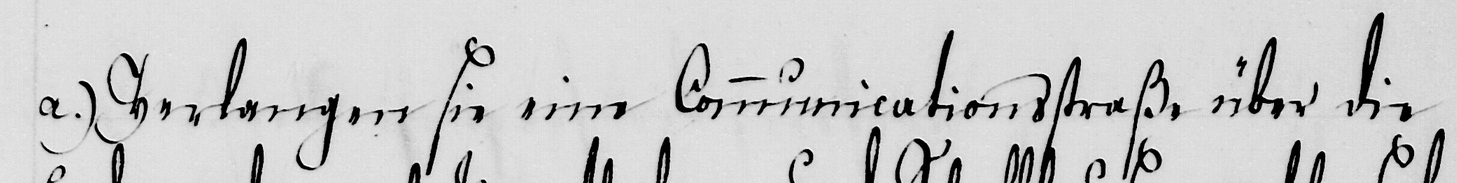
a.) Verlangen sie eine Communicationsstraße über die
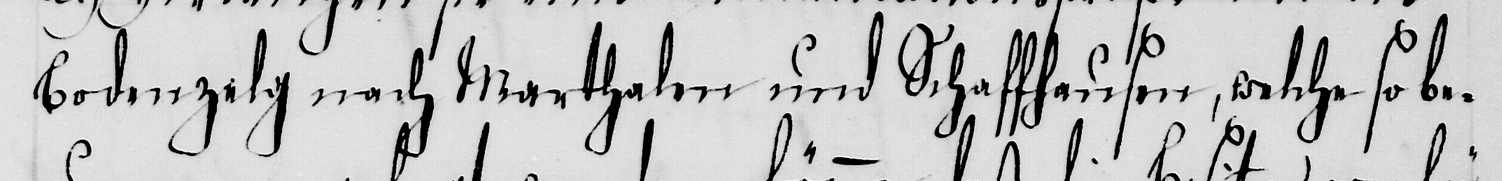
Bodenzelg nach Marthalen und Schaffhausen, welche so b¬
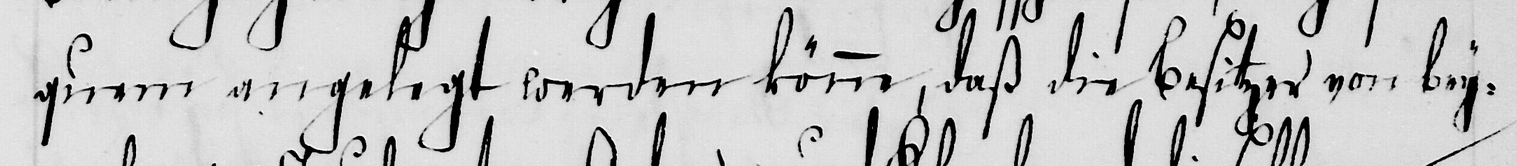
equem angelegt werden könne, daß die Besitzer von bey¬
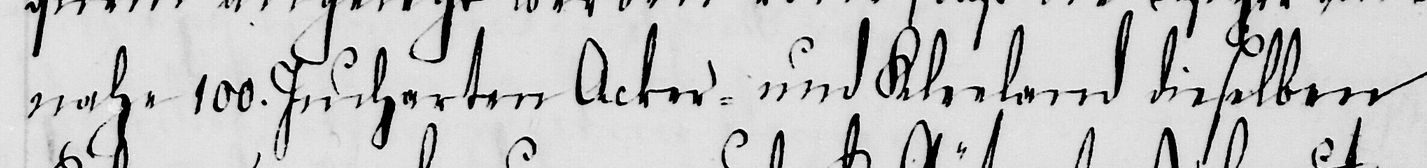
nahe 100. Jucharten Acker- und Kleeland dieselben
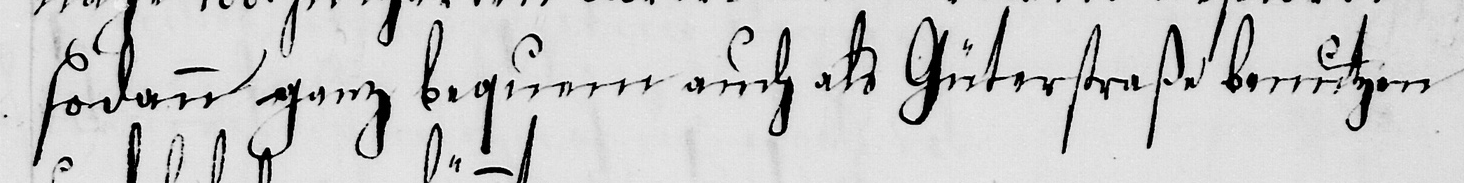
sodann ganz bequem auch als Güterstraße benutzen
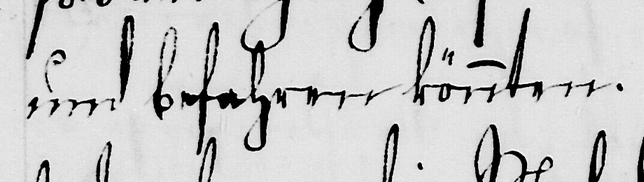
und befahren könnten.
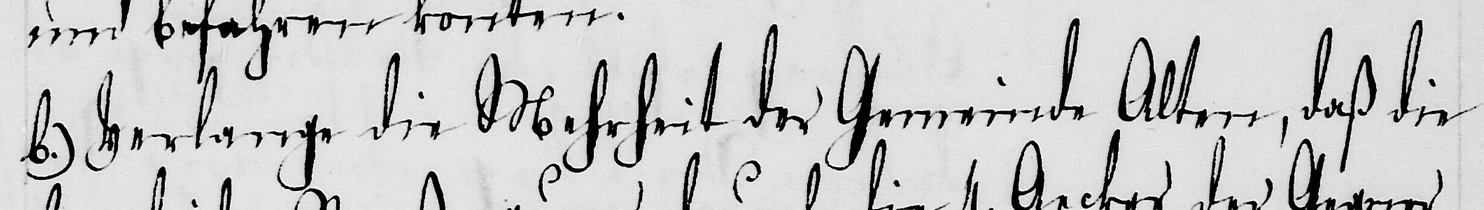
b.) Verlange die Mehrheit der Gemeinde Alten, daß die
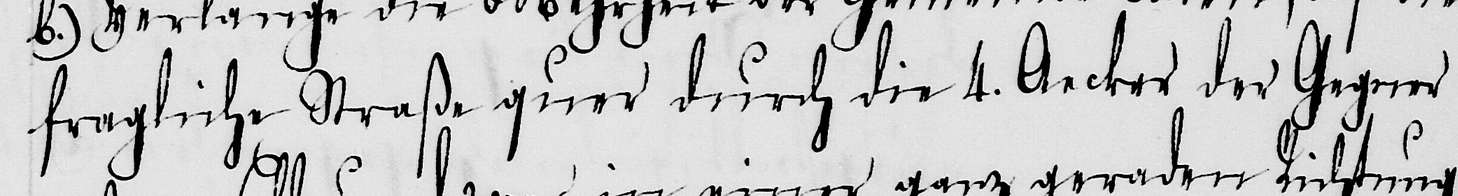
fragliche Straße quer durch die 4. Aecker der Gegner
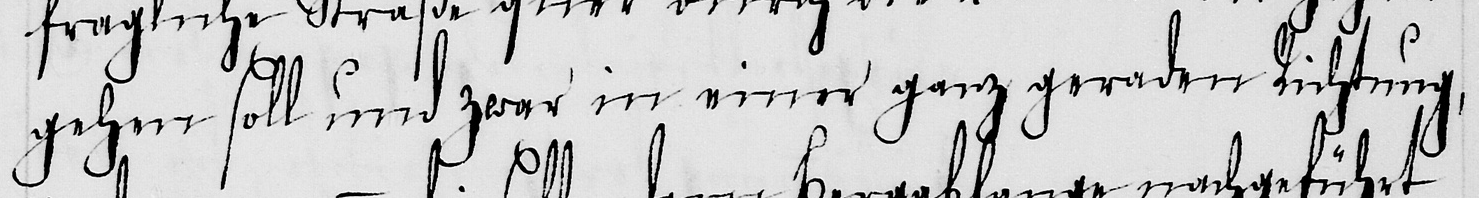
gehen soll und zwar in einer ganz geraden Richtung,
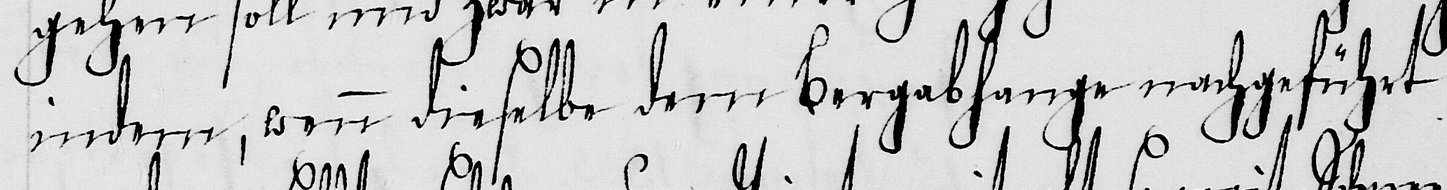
indem, wenn dieselbe dem Bergabhange nachgeführt
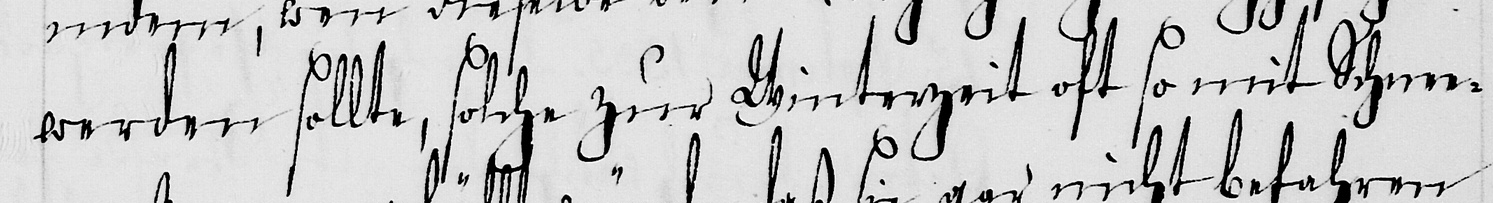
werden sollte, solche zur Winterzeit oft so mit Schnee¬
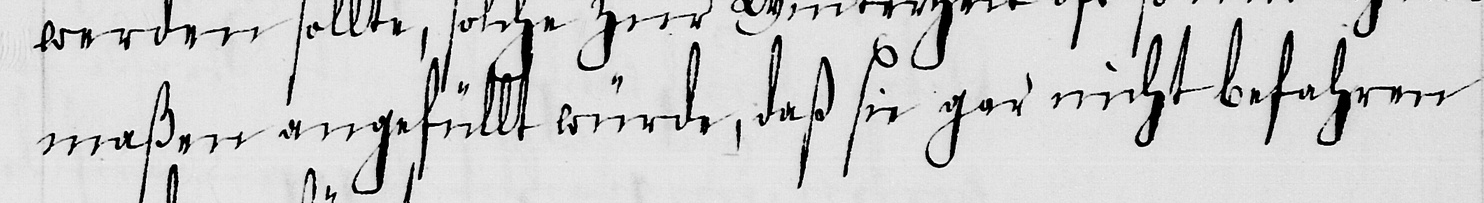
maßen angefüllt würde, daß sie gar nicht befahren
